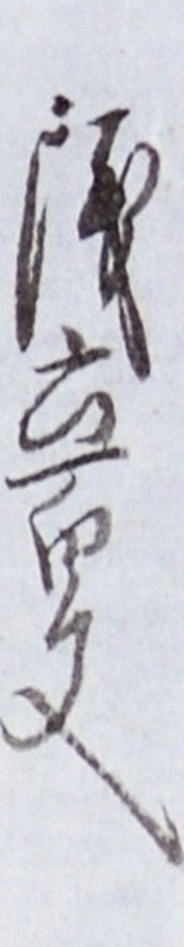銭六百文
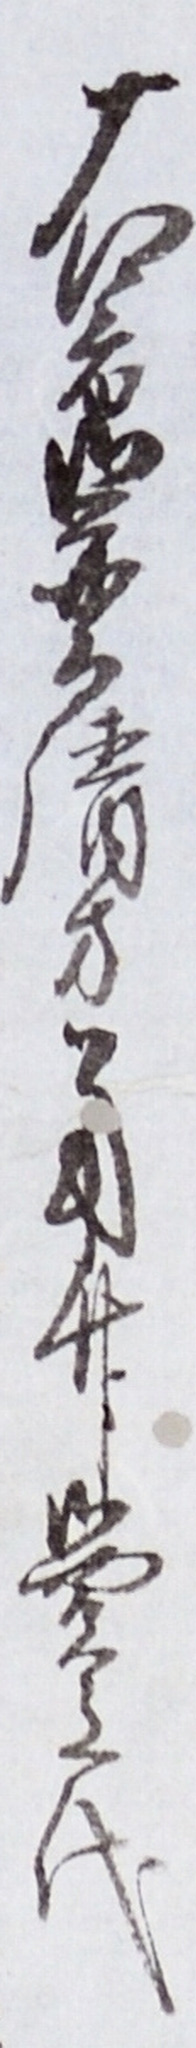右は御普請方御用并買上代
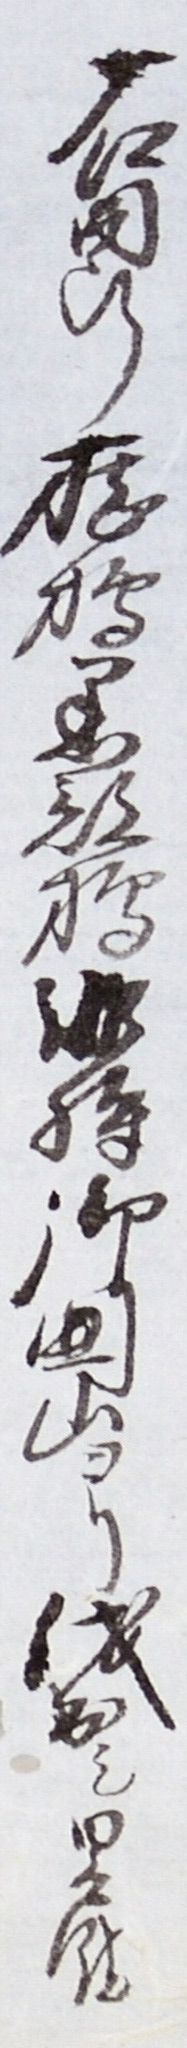右同断椹橋黒部橋非持御囲山より伐出シ日雇候
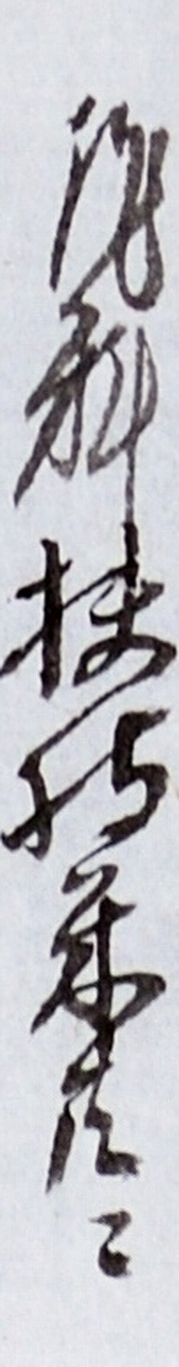作料扶持米共ニ
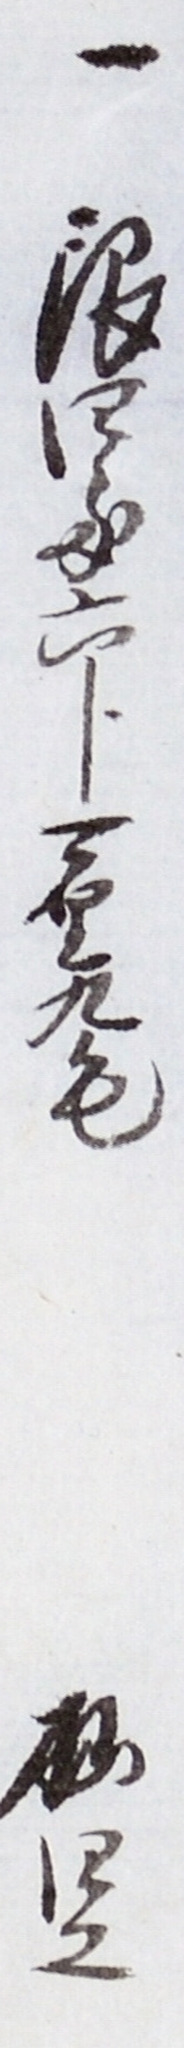一銀四匁六分一厘九毛杣四工
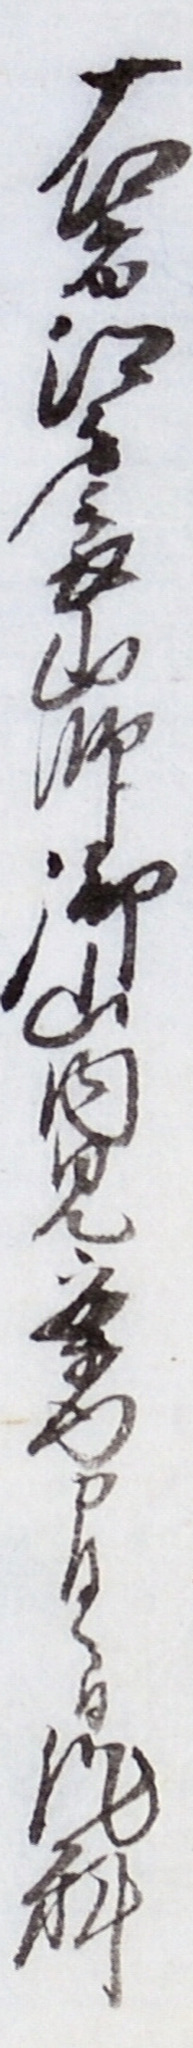右は江戸表山師御山内見案内申付候而作料
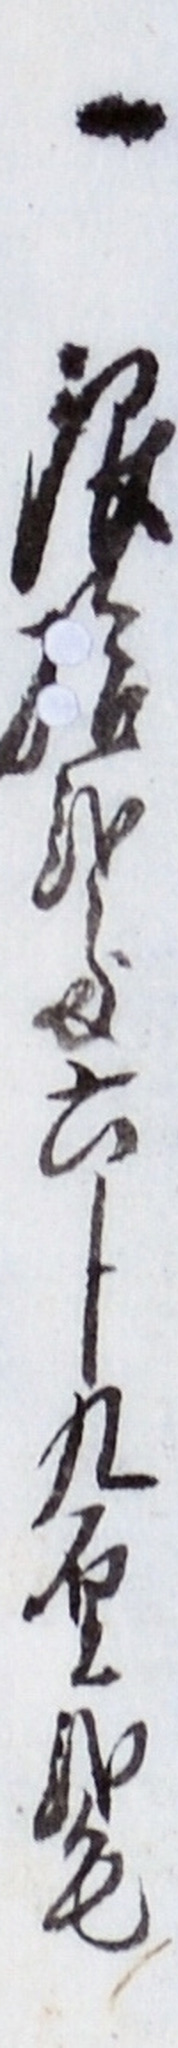一銀拾弐匁六分九厘弐毛
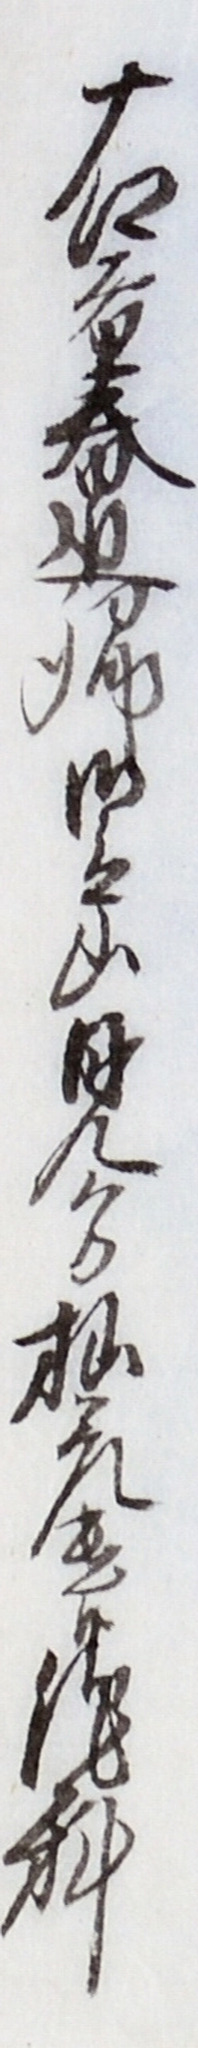右は春近郷御立山見分杣差遣候作料
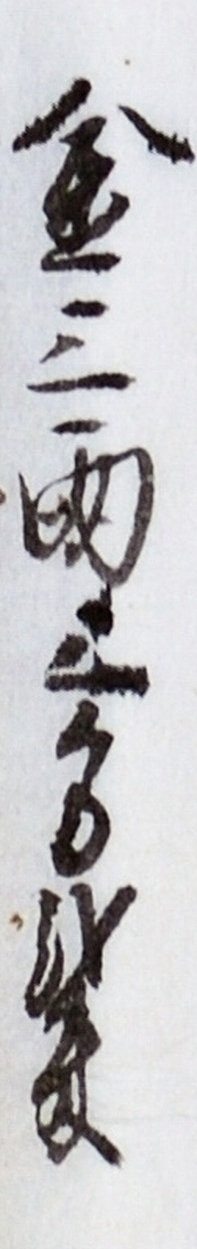金三両三分弐朱
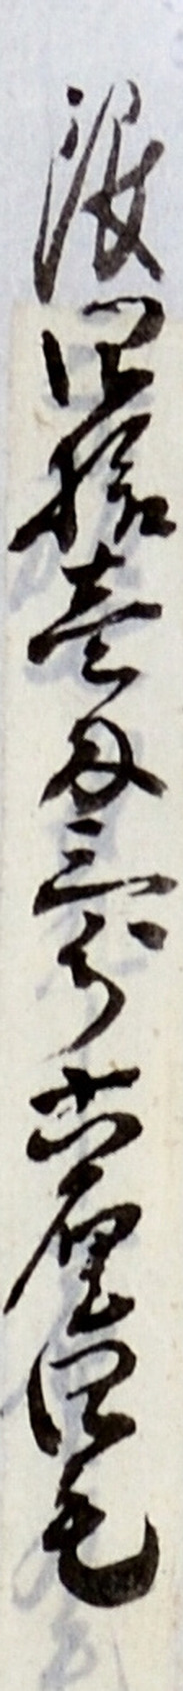〆銀四拾壱匁三分六厘四毛
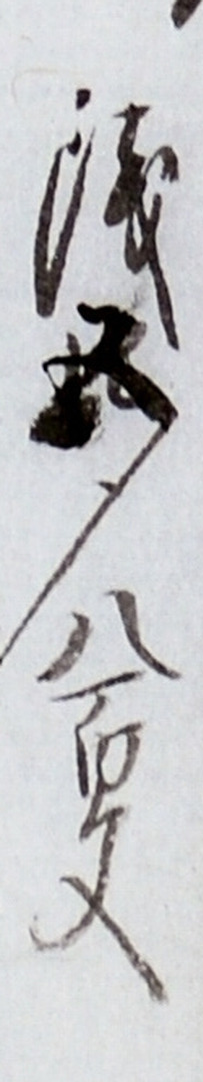銭五〆八百文
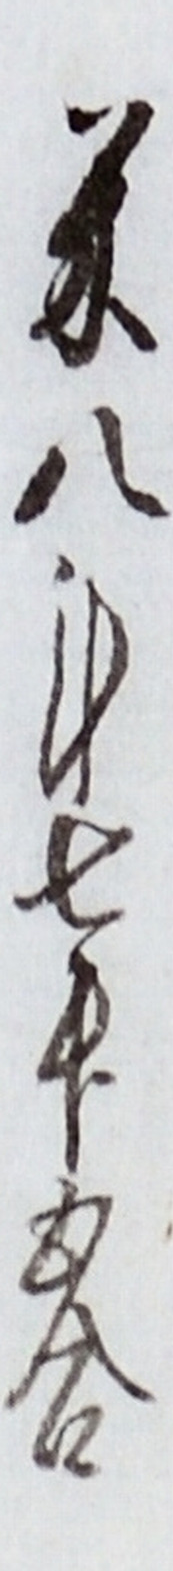米八斗七升五合
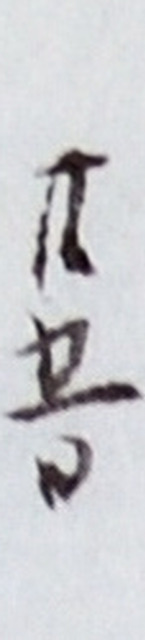廿五日
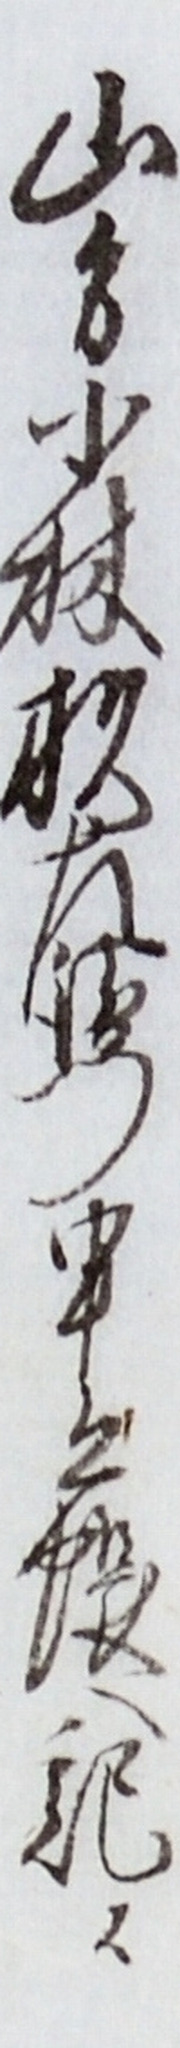山方小林杉左衛門申立帳へ記ス
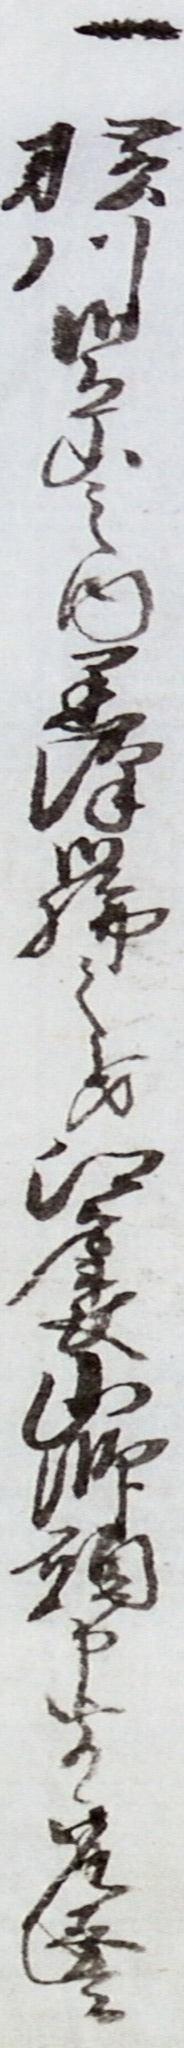一横川御立山之内黒沢御払之義江戸表山師願申聞候先達而
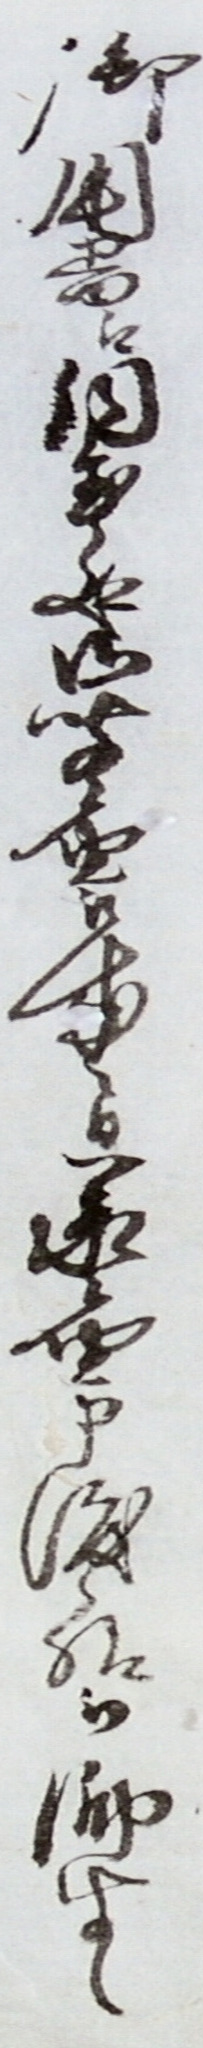御用番江調置之処御聞届被成候ニ付承届申渡候様被仰聞候
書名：御山奉行御用控
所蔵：伊那市立高遠町図書館・合同会社AMANE
